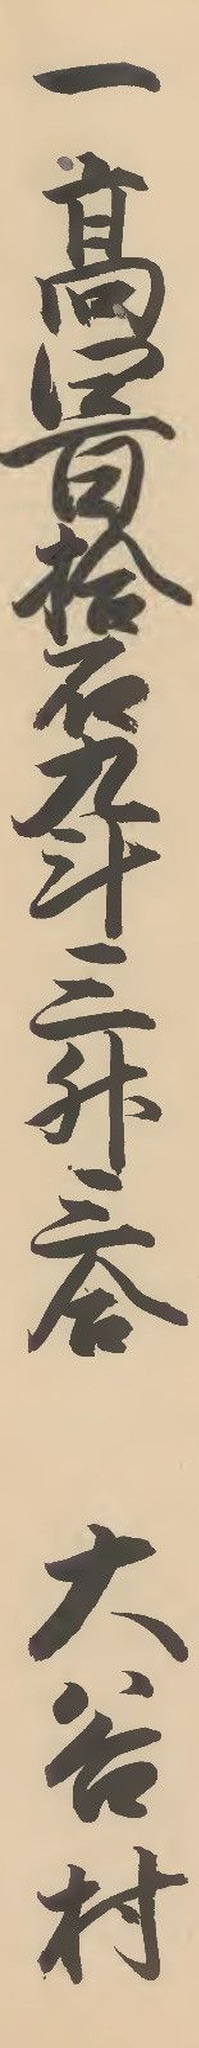一高四百拾石九斗三升三合大谷村

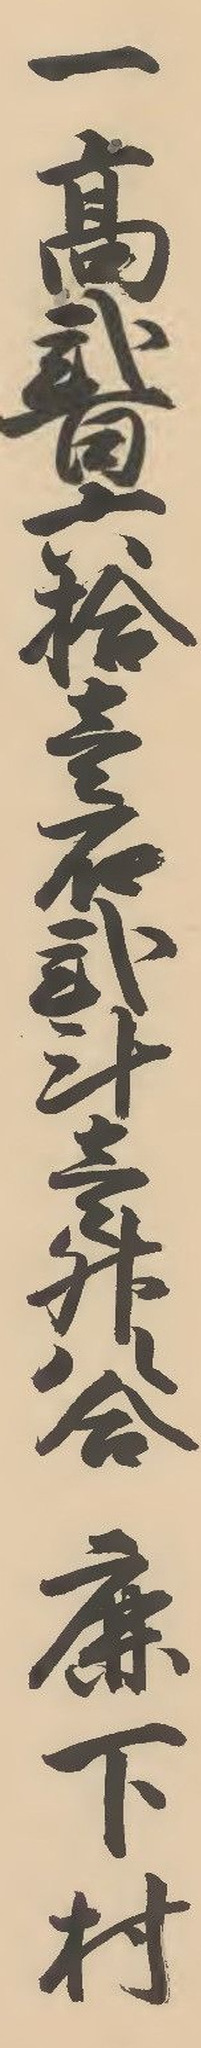一高弐百六拾壱石弐斗壱升八合鹿下村
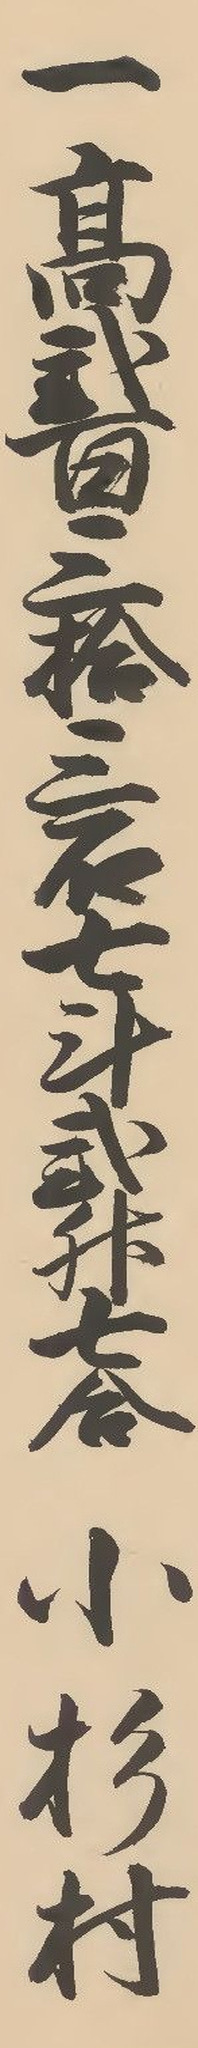一高弐百三袷三石七斗弐升七合小杉村
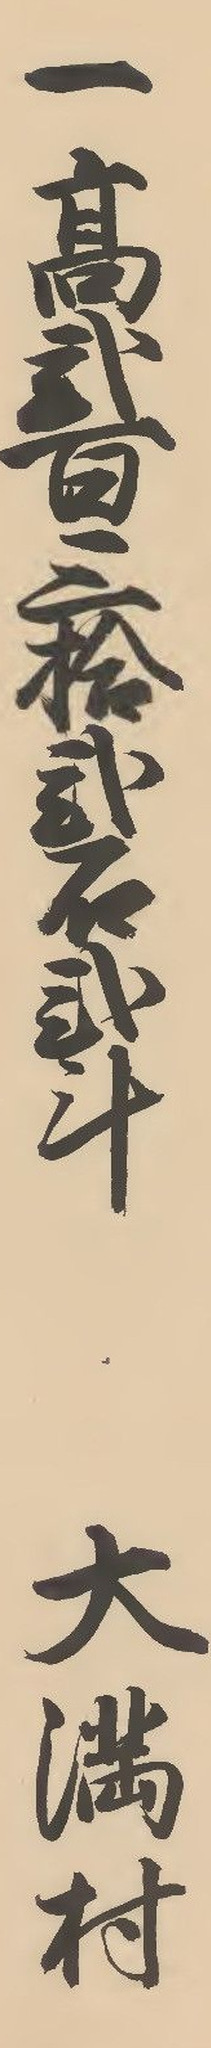一高弐百三拾弐石弐斗大満村
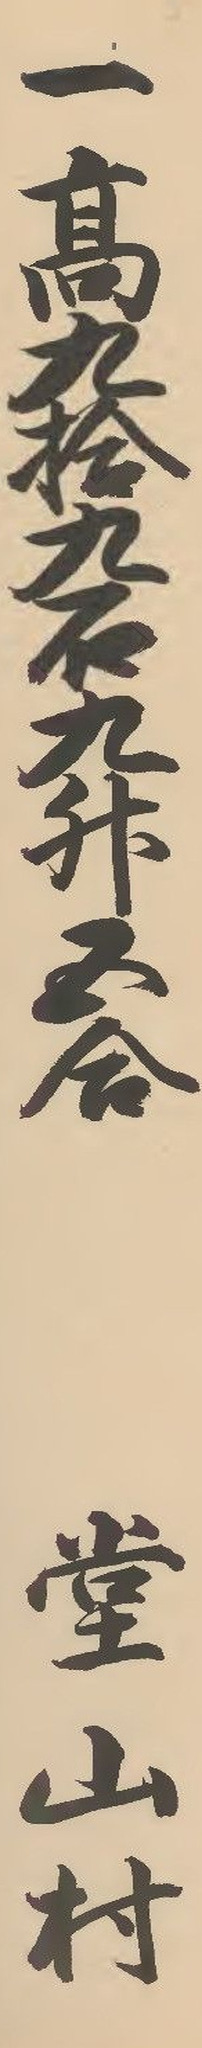一高九拾九石九升五合堂山村
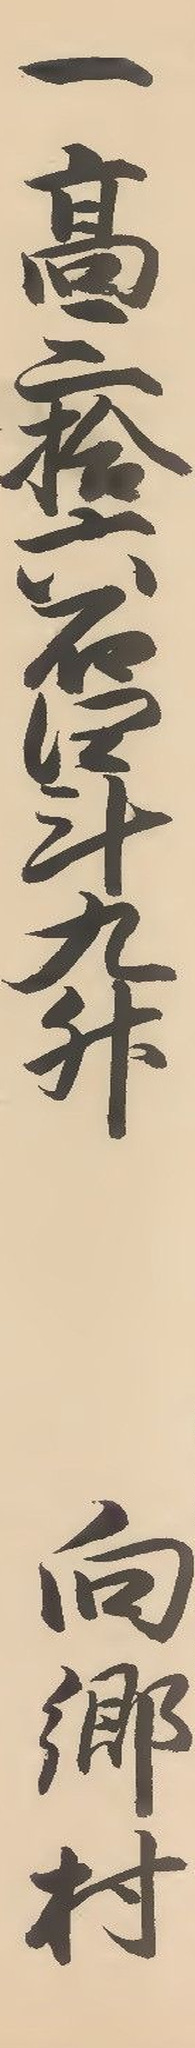一高三拾六石四斗九升向郷村
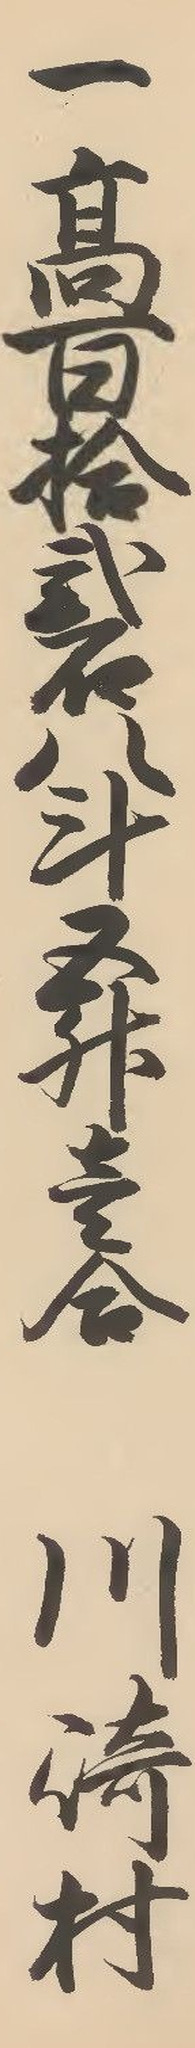一高百拾弐石八斗五升壱合川崎村
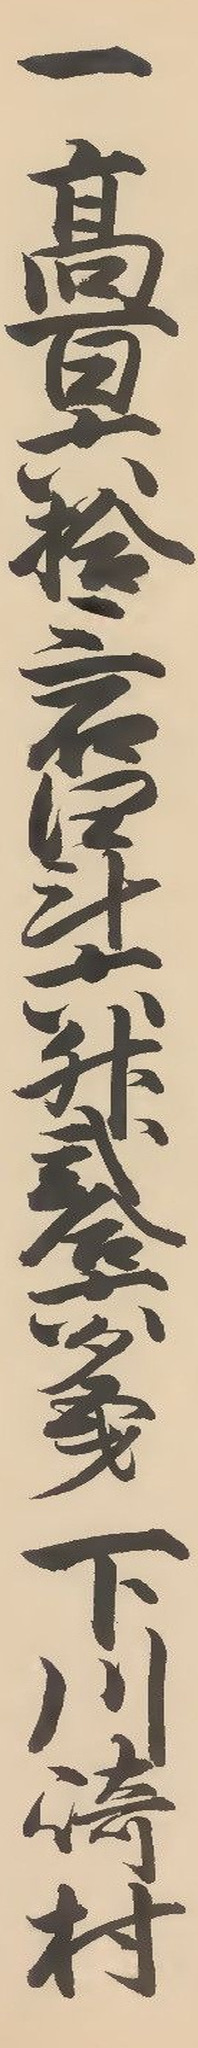一高百六拾三石四斗六升弐合六勺五才下川崎村
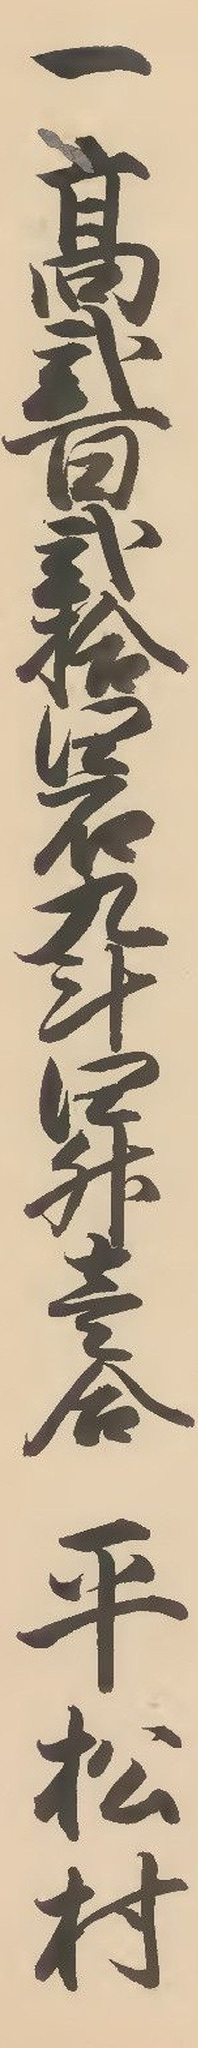一高弐百弐拾四石九斗四升壱合平松村

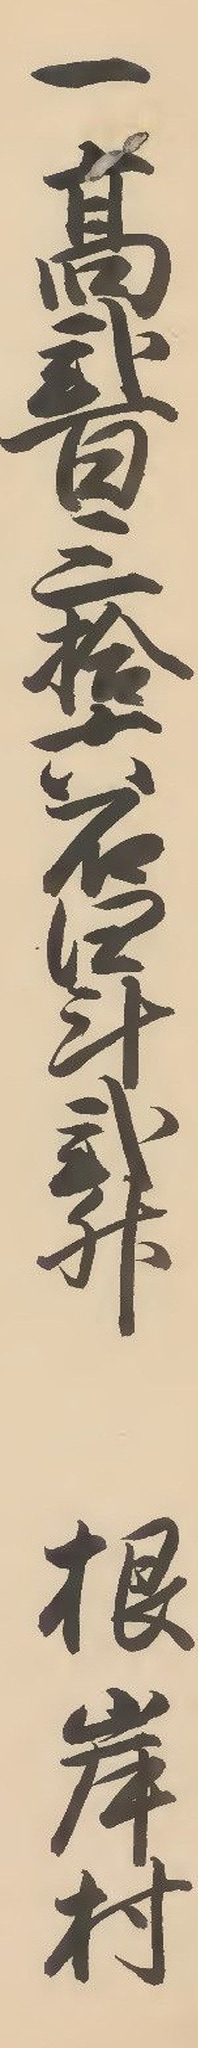一高弐百三拾六石四斗弐升根岸村
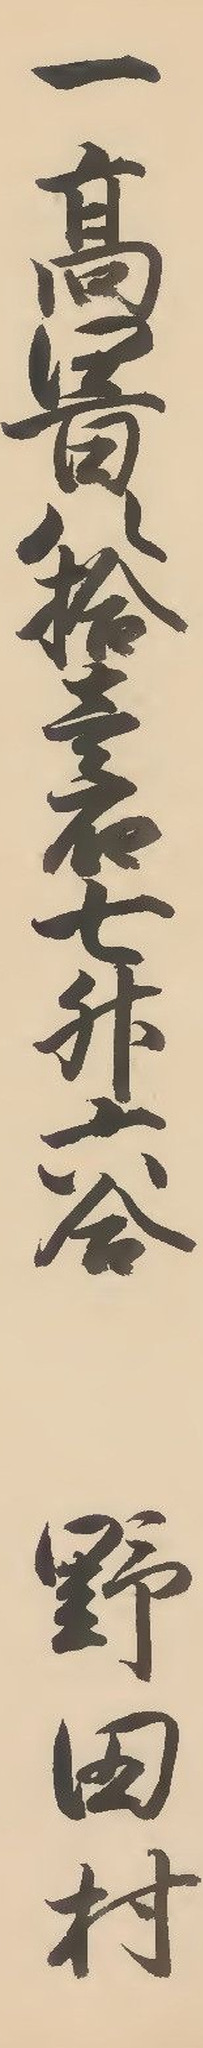一高四百八拾壱石七升六合野田村
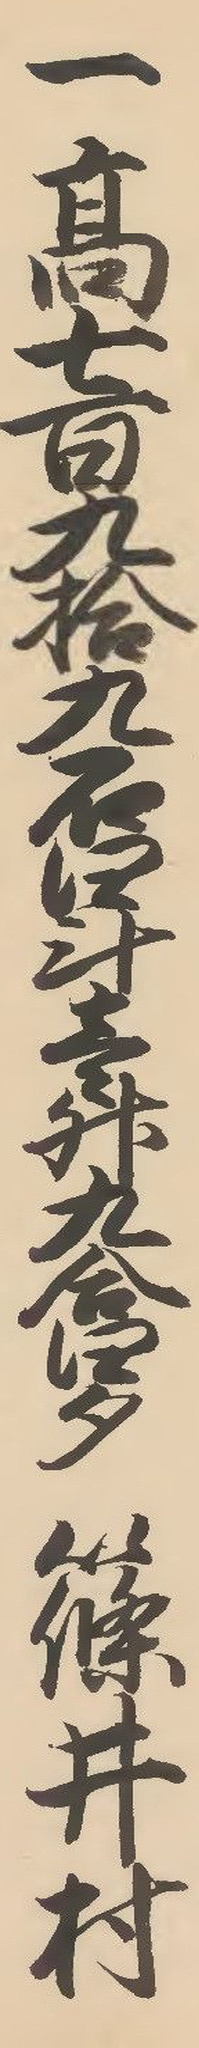一高七百九拾九石四斗壱升九合四勺篠井村
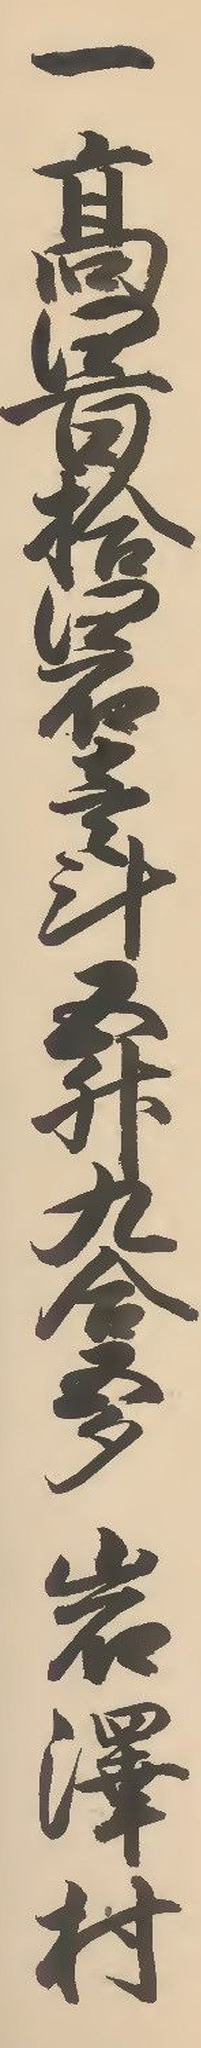一高四百拾四石壱斗五升九合五勺岩澤村
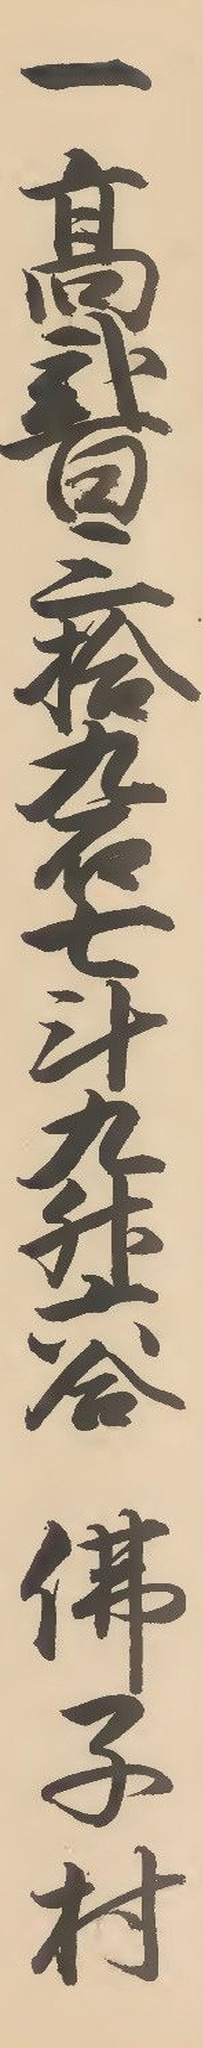一高弐百三拾九石七斗九升六合佛子村
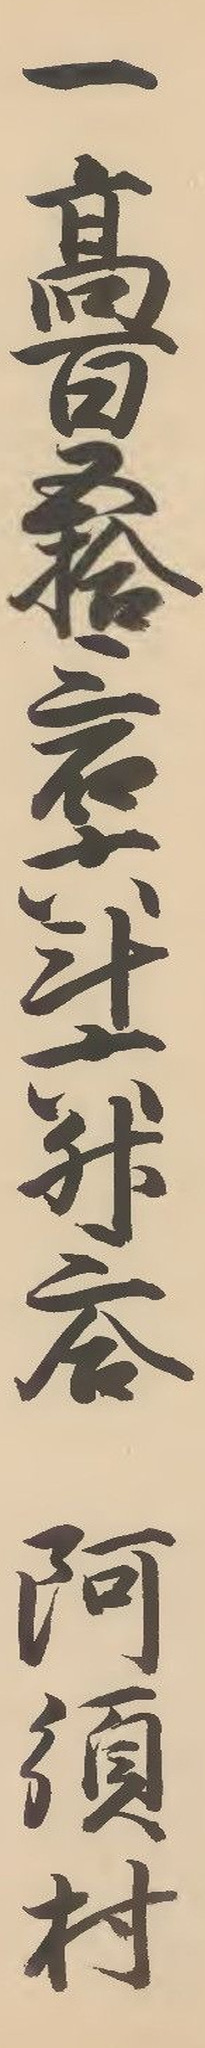一高百五拾三石六斗六升三合阿須村
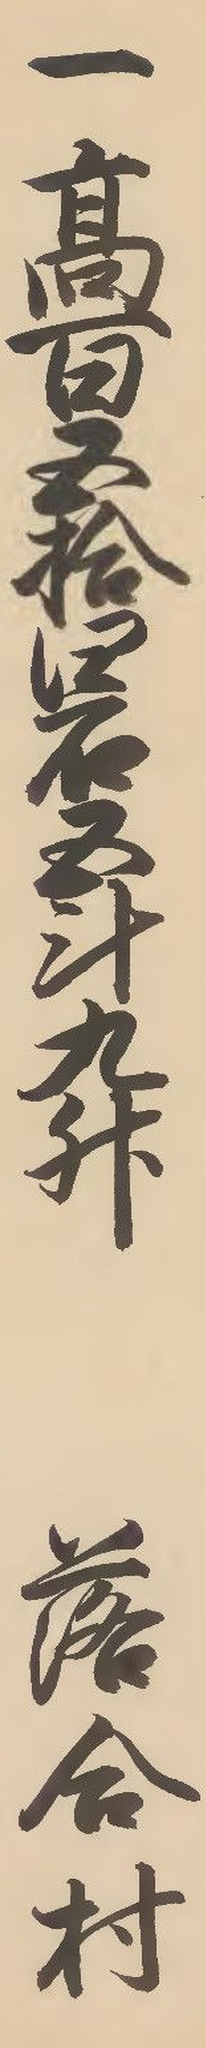一高百五拾四石五斗九升落合村
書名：武蔵国郷帳　上
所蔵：国立公文書館 National Archives of Japan
